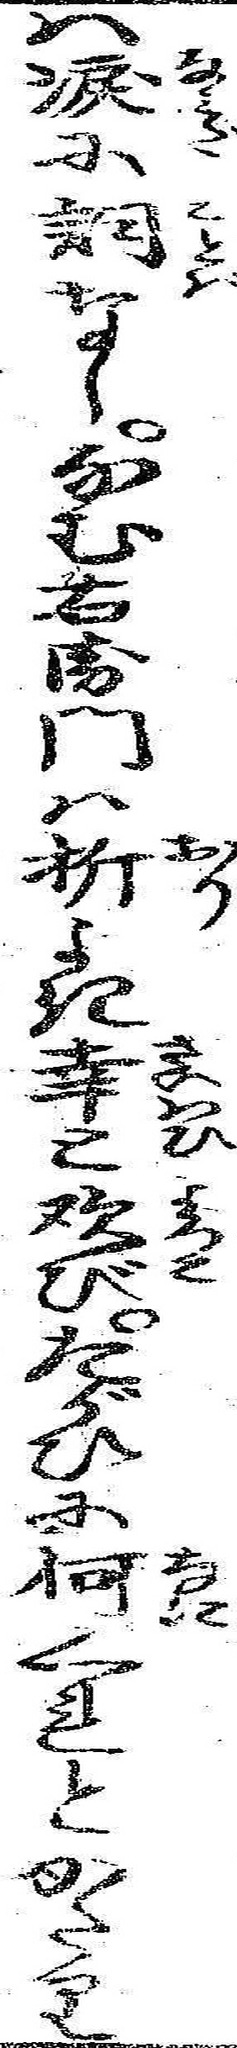は涙に詞なし。なむ右衛門は折よき幸と歓び。たがひに何くれとかたり
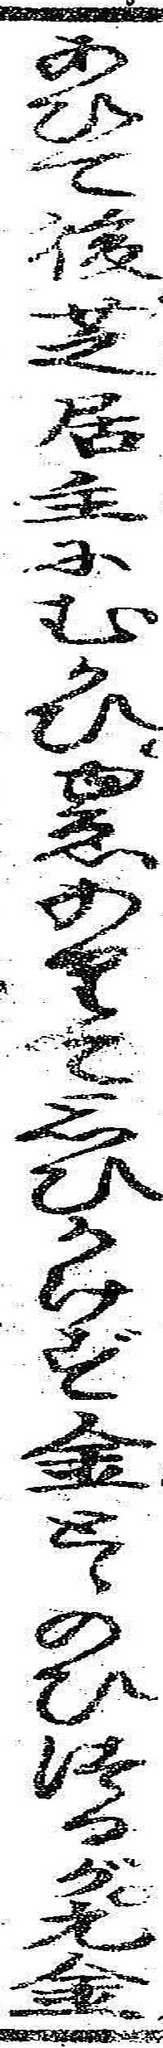あひて後。芝居主にむかひ。ゆゑありて思ひかけず金とゝのひつるが。元金
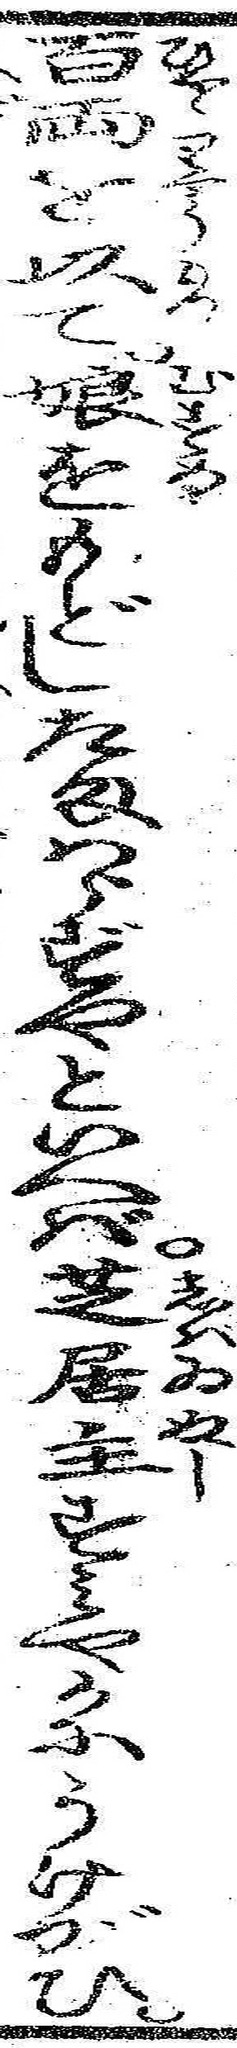百両を以て。娘をもどしたまはらずやといへば。芝居主すみやかにうけがひ。
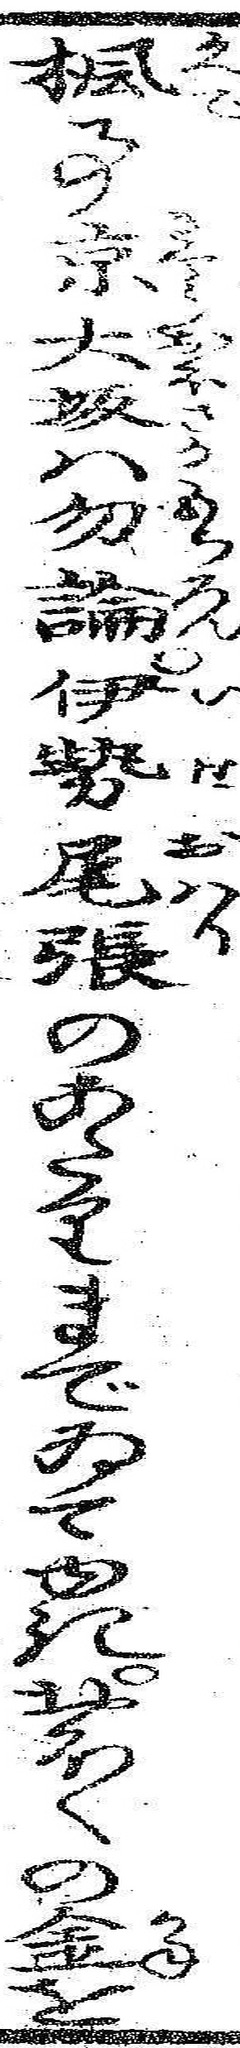楓事京大坂は勿論。伊勢尾張のあたりまでゐてゆき。おほくの金を
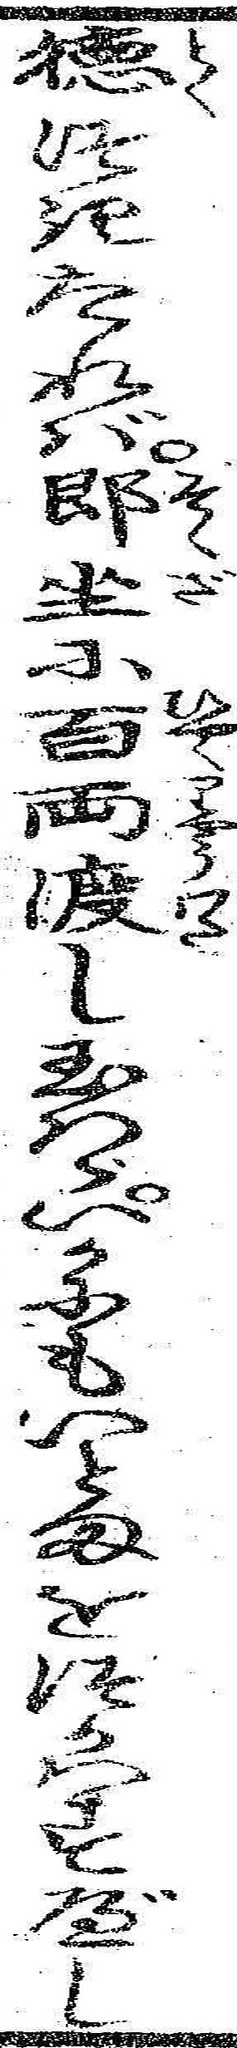徳つきたれば。即坐に百両渡し玉はゞ。いかにもいとまをつかはすべし
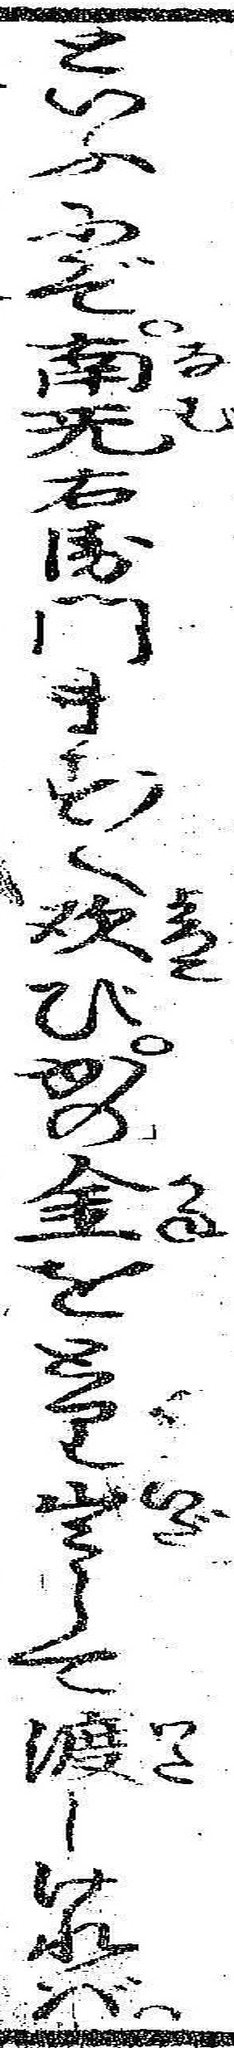といふにぞ。南無右衛門ます〳〵へ歓び。かの金をとり出して渡しければ。
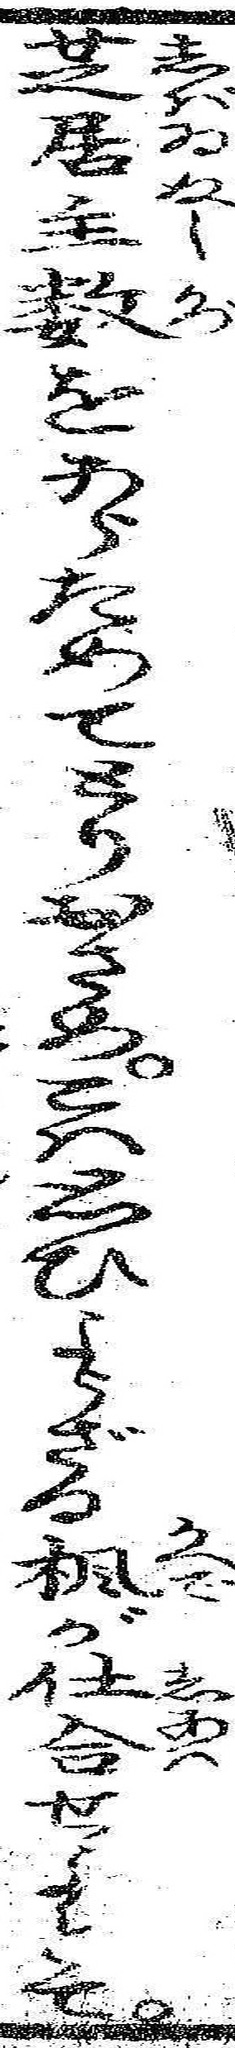芝居主数をあらためてとりおさめ。こは思ひよらざる楓が仕合せよとて。
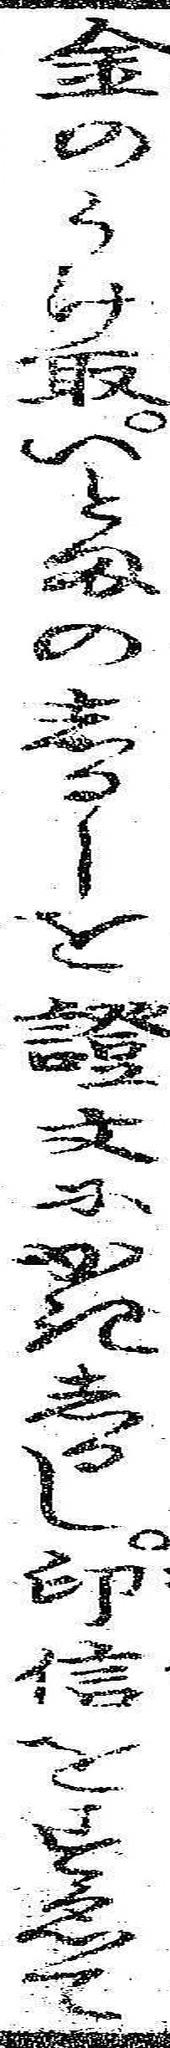金のうけ取。いとまのしるしを証文にかきしるし。印信をすゑて

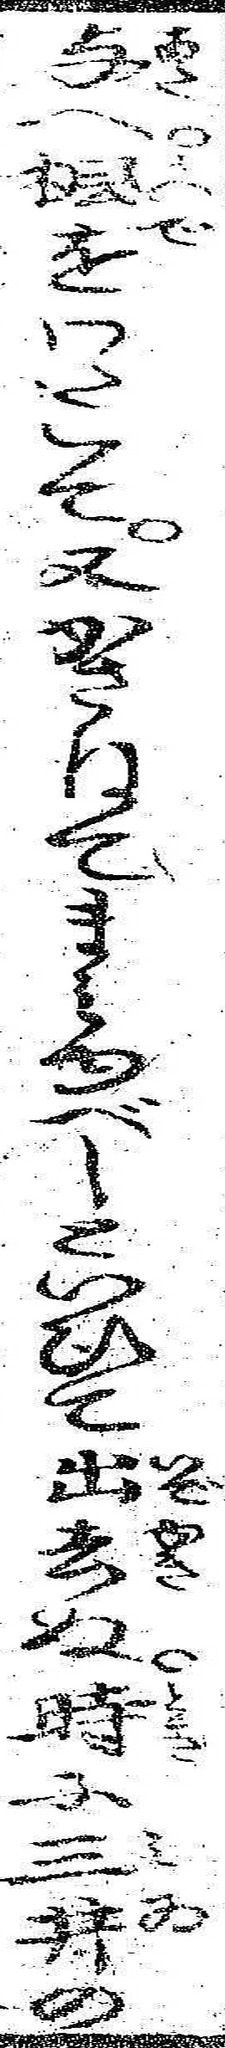与へ。楓をわたして。又かさねてまみゆべしといひて出去ぬ。時に三井の
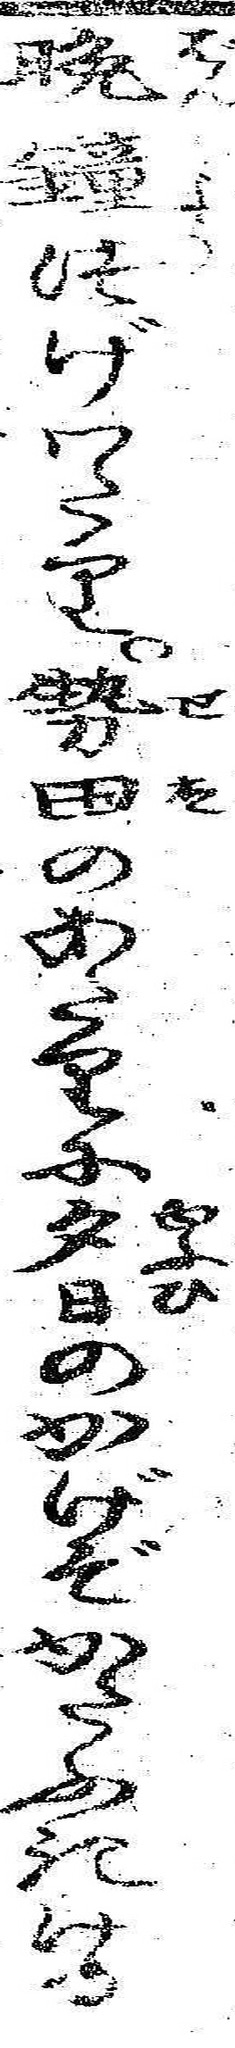晩鐘つげわたり。勢田のあたりに夕日のかげぞかたふきける
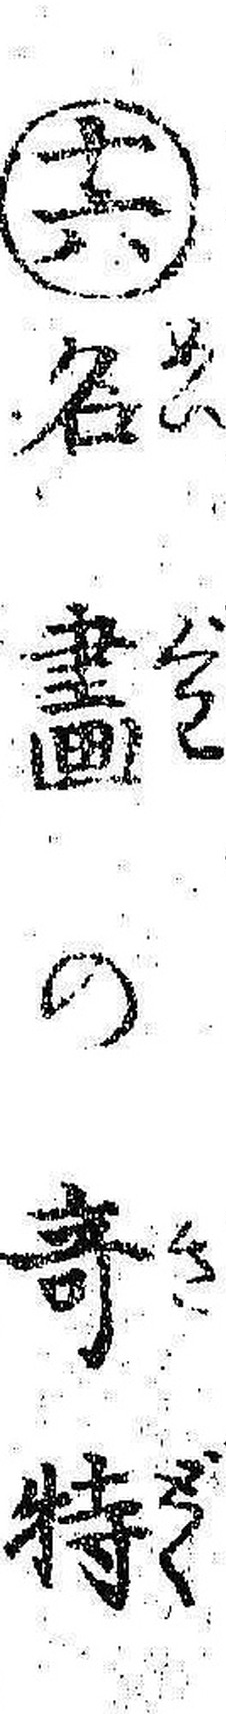十六名画の奇特
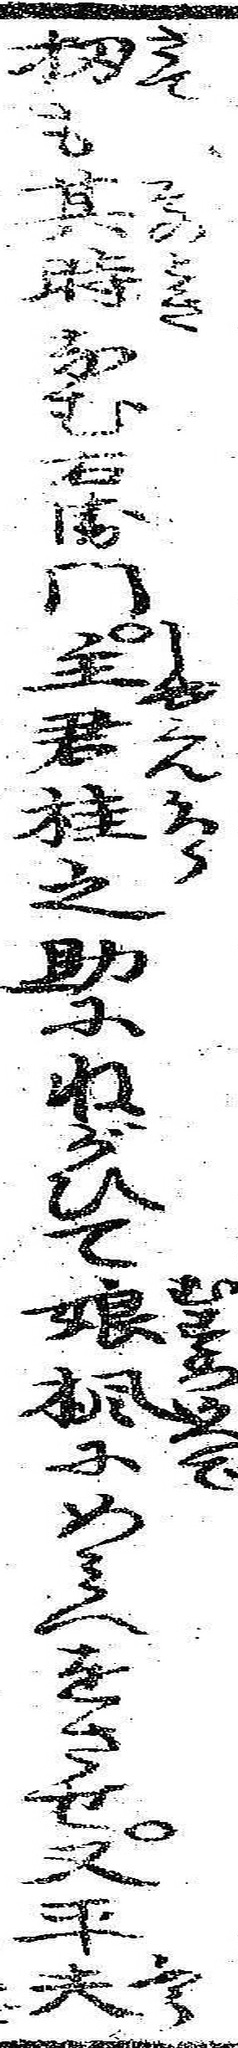扨も其時なむ右衛門。主君桂之助にねがひて娘楓にめみへをさせ。又平夫
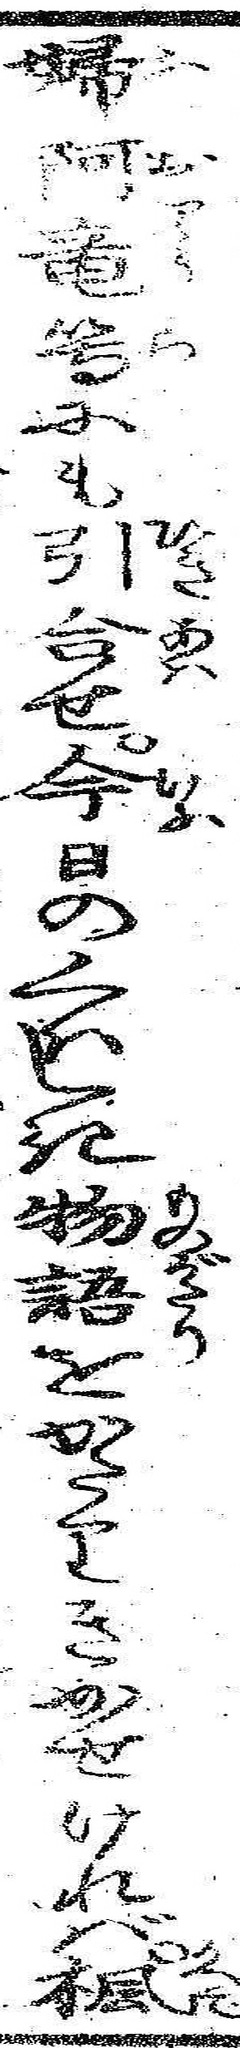婦阿竜等にも引合せ。今日のくはしき物語をかたりきかせければ。楓
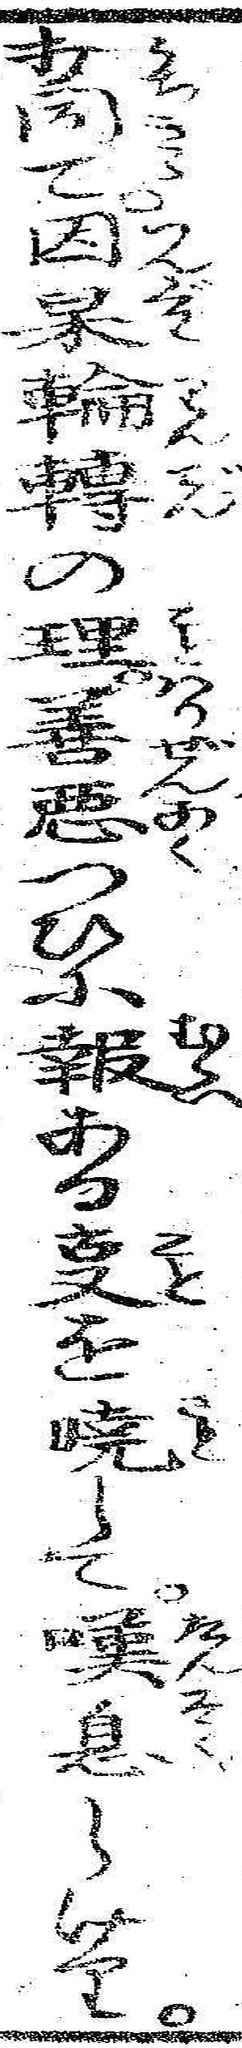打間て。因果輪転の理。善悪つひに報ある事を暁して。嘆息しけり。
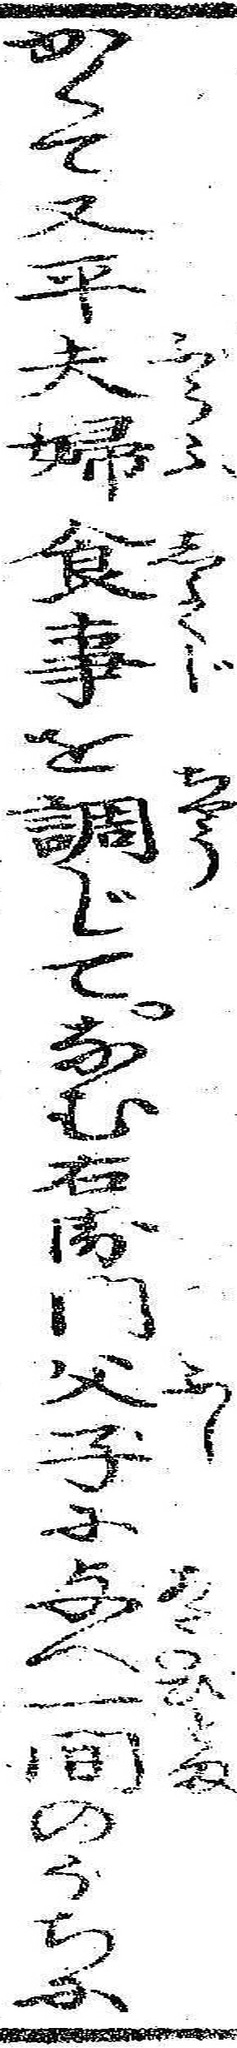かくて又平夫婦食事を調じて。なむ右衛門父子に与へ。一間のうちに
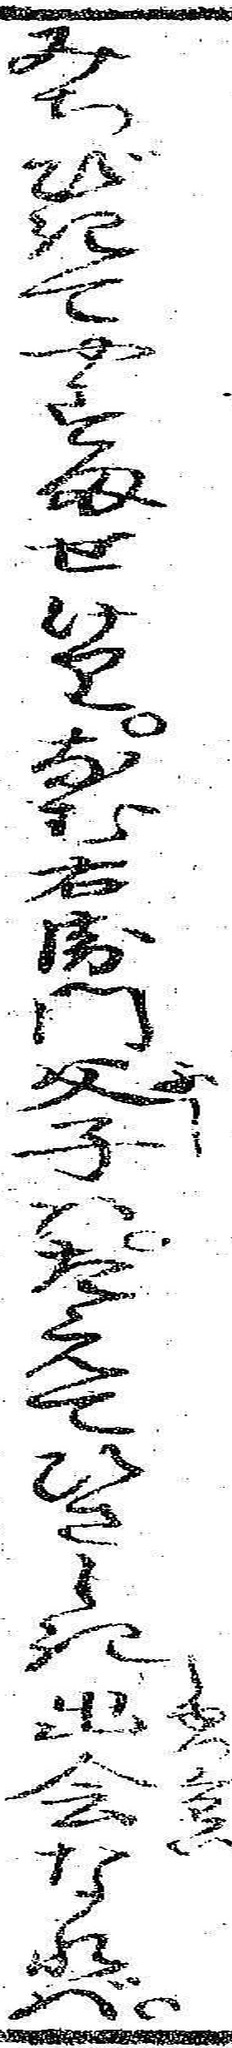みちびきてやすませけり。なむ右衛門父子は。たえてひさしき出会なれば。
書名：昔話稲妻表紙
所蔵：国文学研究資料館
